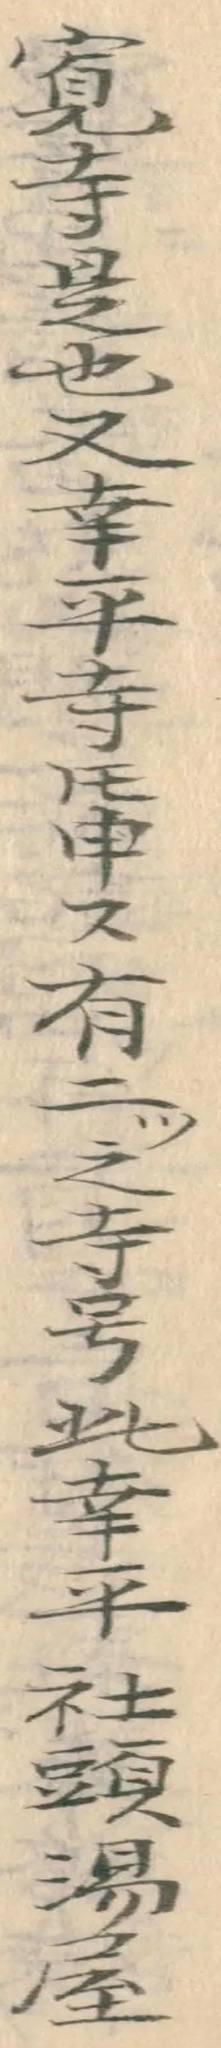寛寺是也又幸平寺トモ申ス有二ツ之寺号此幸平社頭湯屋
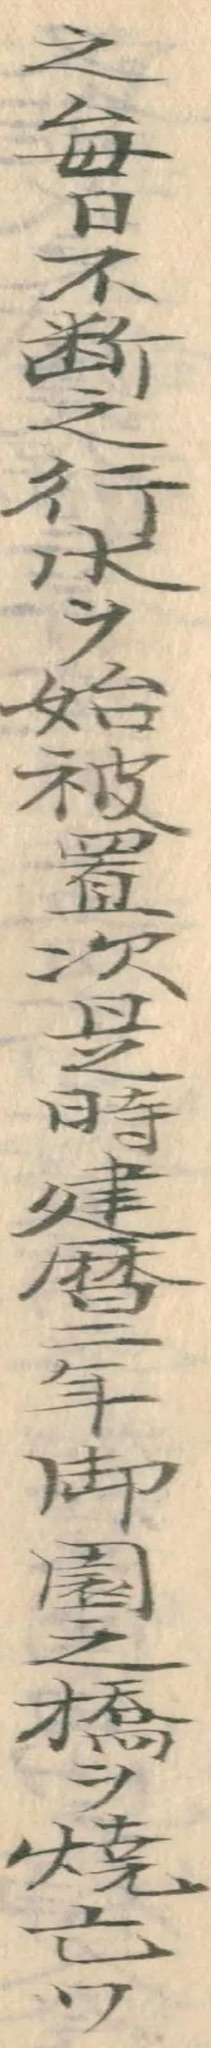之毎日不断之行水ヲ始被置次是時建暦二年御園之橋ヲ焼亡ワ
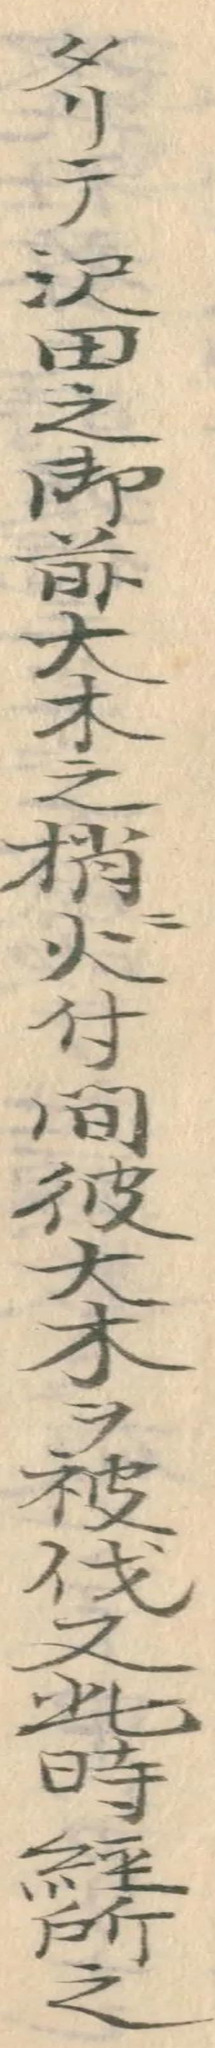タリテ沢田之御前大木之梢ニ火付間彼大木ヲ被伐又此時経所之
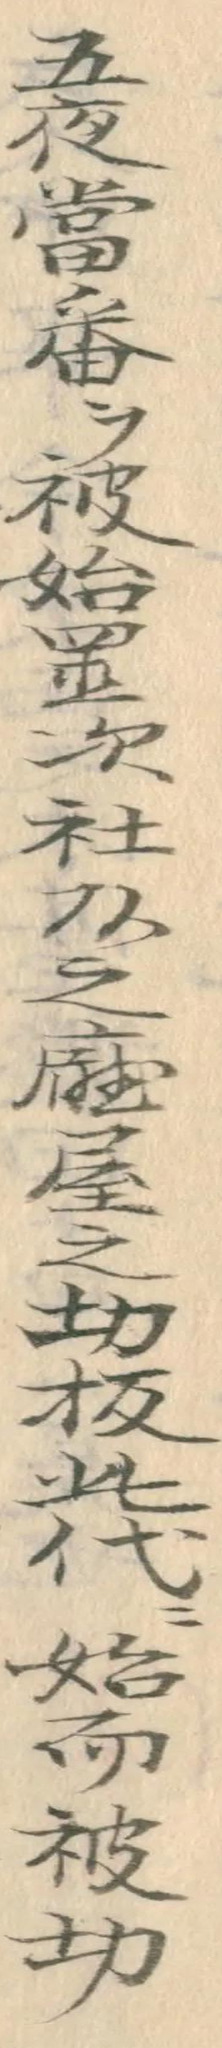五夜当番ヲ被始置次社頭之庁屋之切板此代ニ始而被切
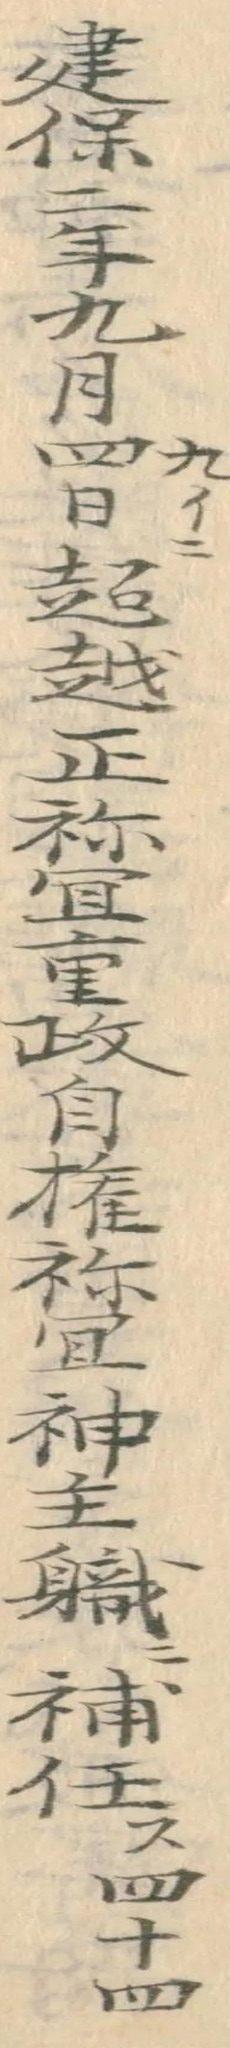能久建保二年九月四日超越正祢宜重政自権祢宜神主職ニ補任ス四十四
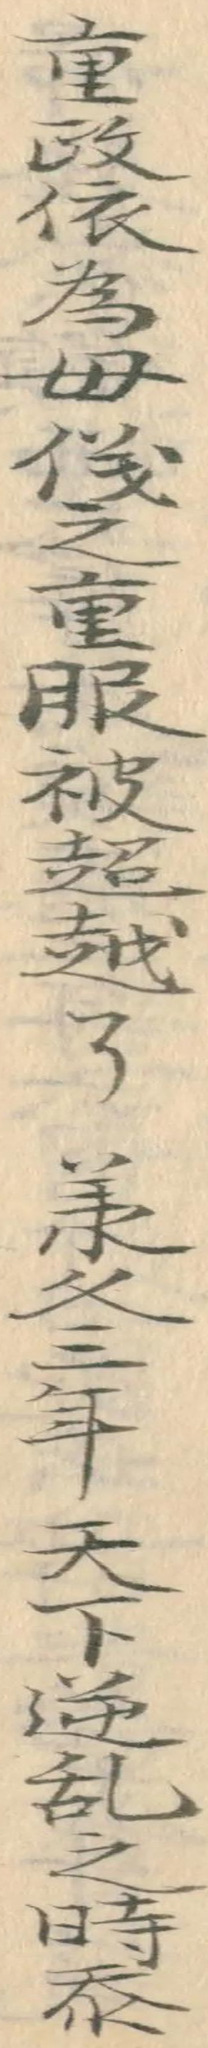重政依為母儀之重服被超越了承久三年天下逆乱之時忝
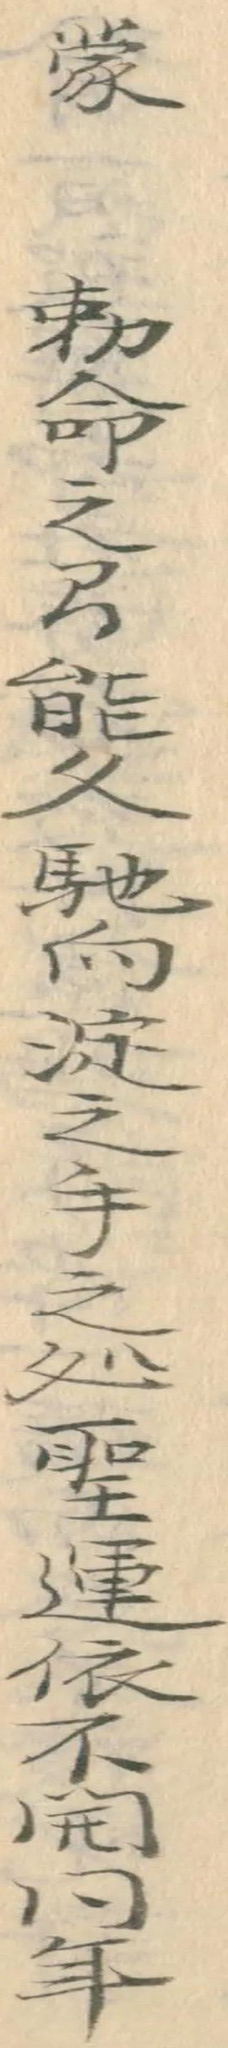蒙勅命之間能久馳向淀之手之処聖運依不開同年

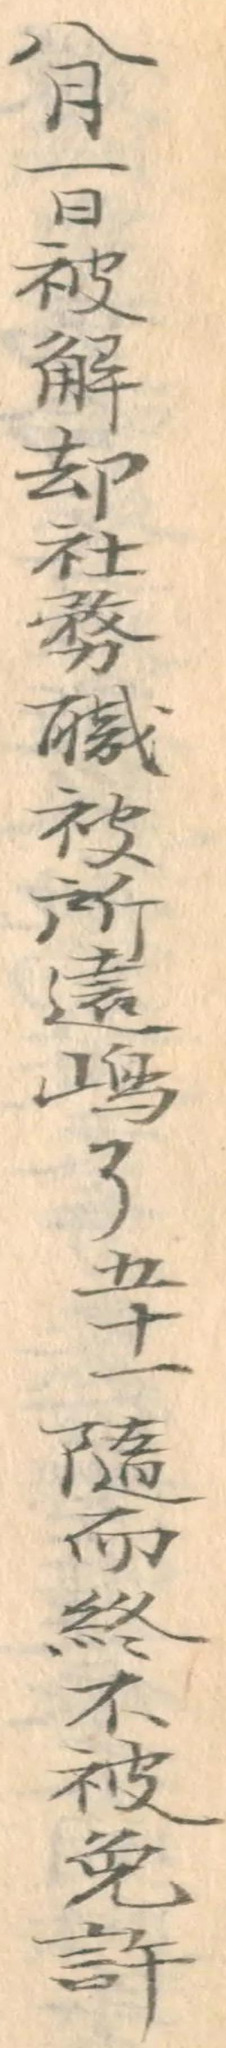八月一日被解却社務職被所遠嶋了五十一隨而終不被免許
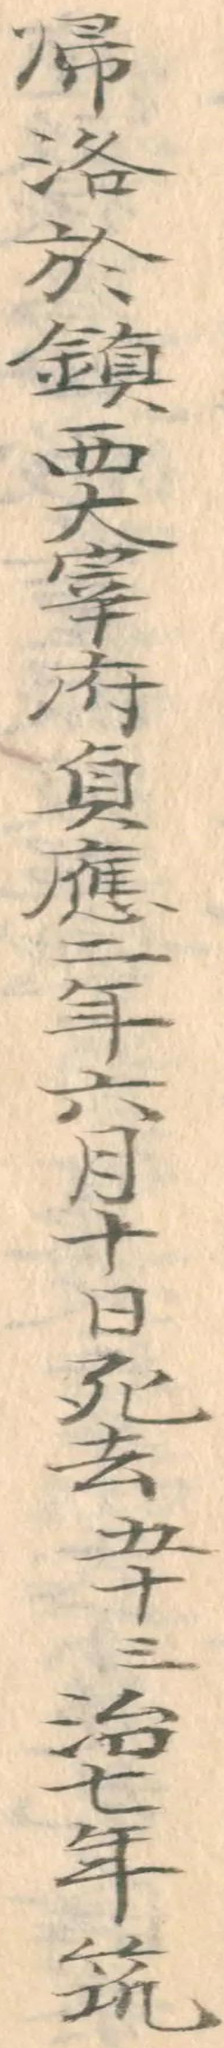帰洛於鎮西大宰府貞応二年六月十日死去五十三治七年筑
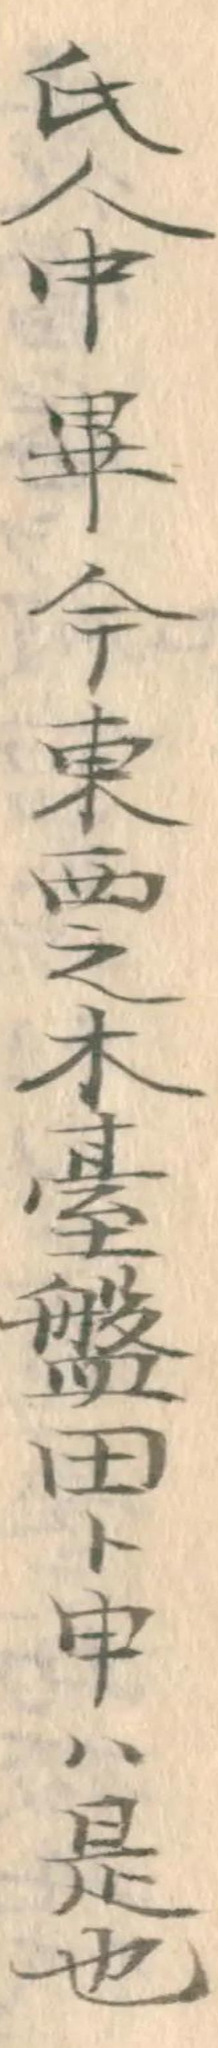氏人中畢今東西之木台盤田ト申ハ是也
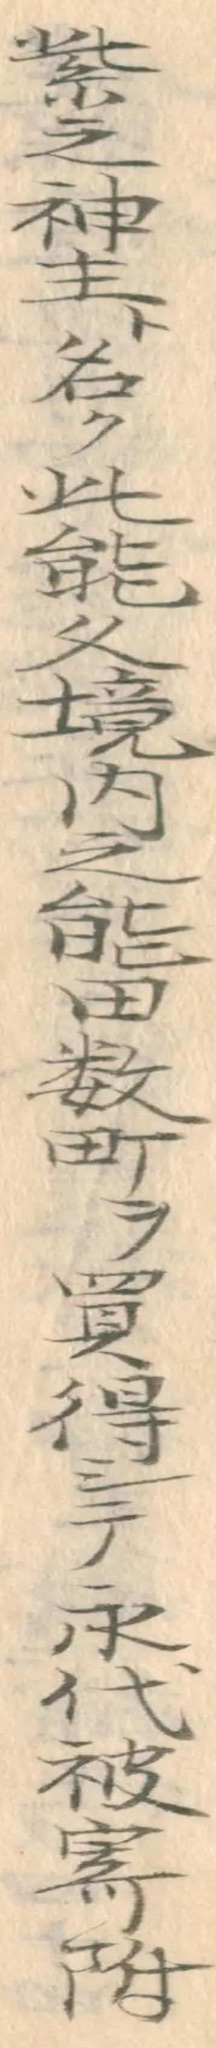紫之神生ト名ク此能久境内之能田数町ヲ買得シテ永代被寄附
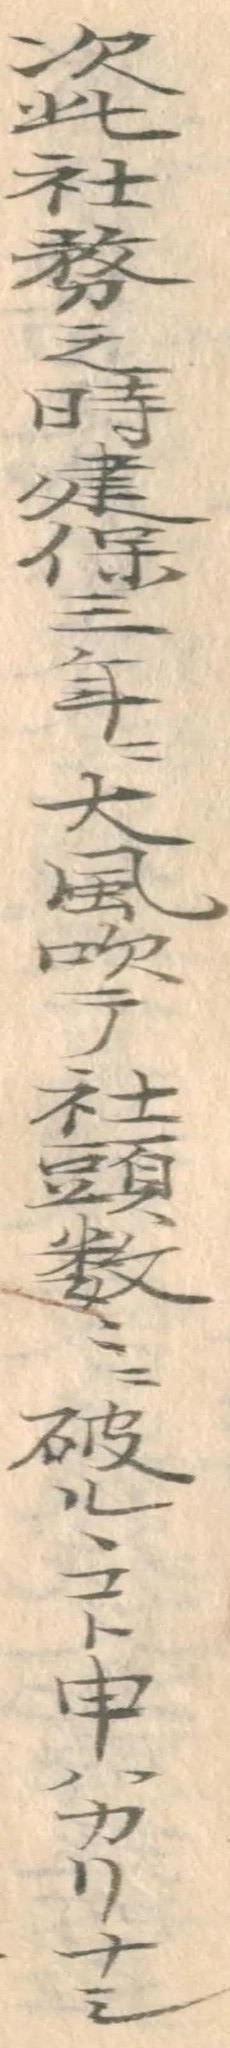次此社務之時建保三年ニ大風吹テ社頭数々ニ破ルヽコト申ハカリナシ
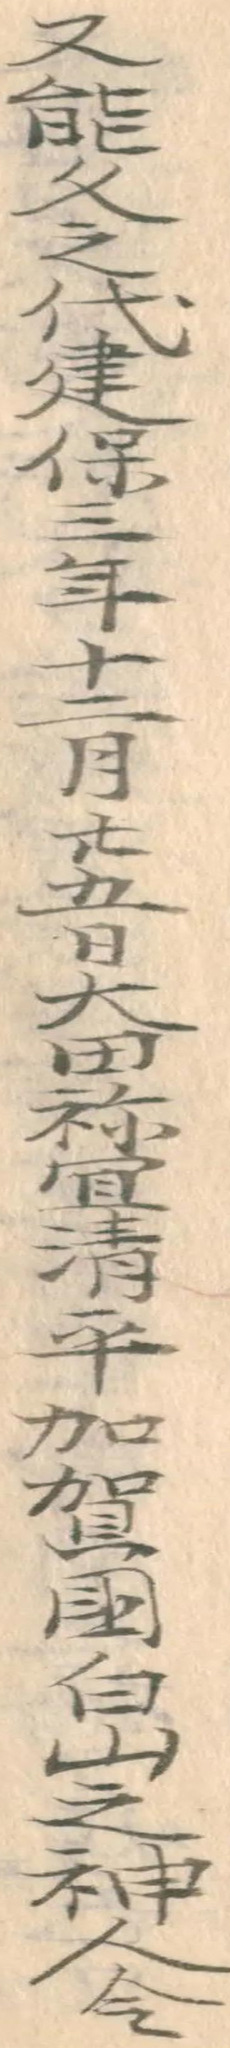又能久之代建保三年十二月廿五日大田祢宜清平加賀国白山之神人令
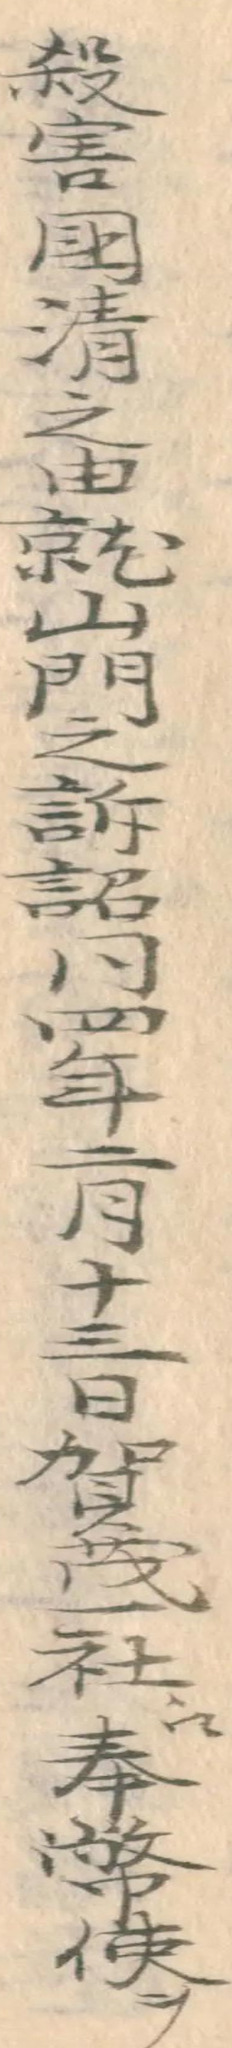殺害国清之由就山門之訴詔同四年二月十三日賀茂一社江奉幣使ヲ
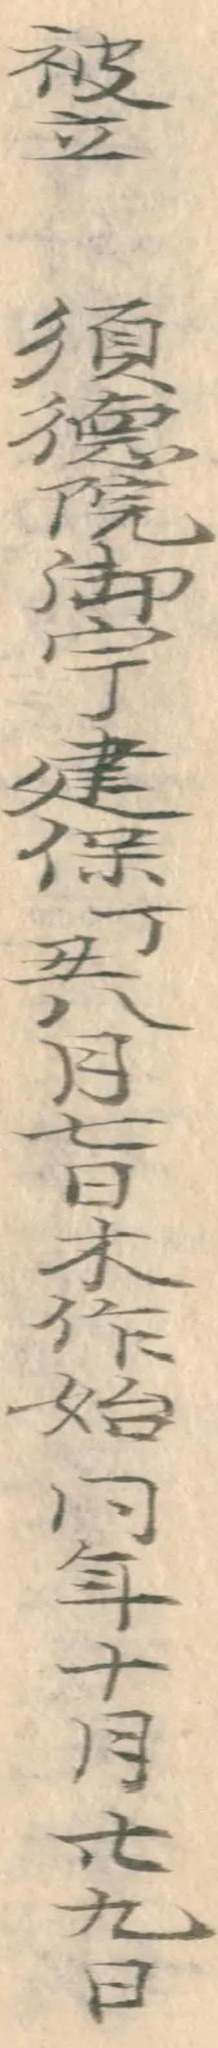被立須徳院御宇建保丁丑八月七日木作始同年十月廿九日
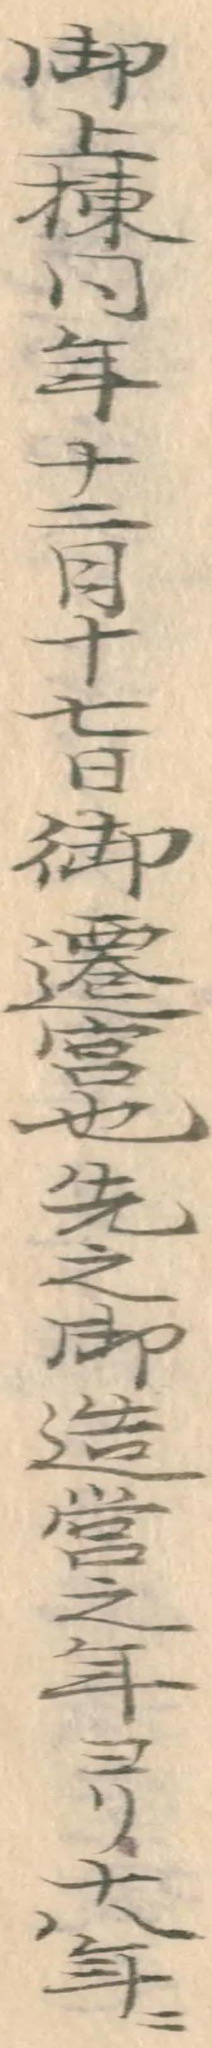御上棟同年十二月十七日御遷宮也先之御造営之年ヨリ十八年ニ
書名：賀茂社記録. 第24冊
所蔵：国立国会図書館 National Diet Library, JAPAN
